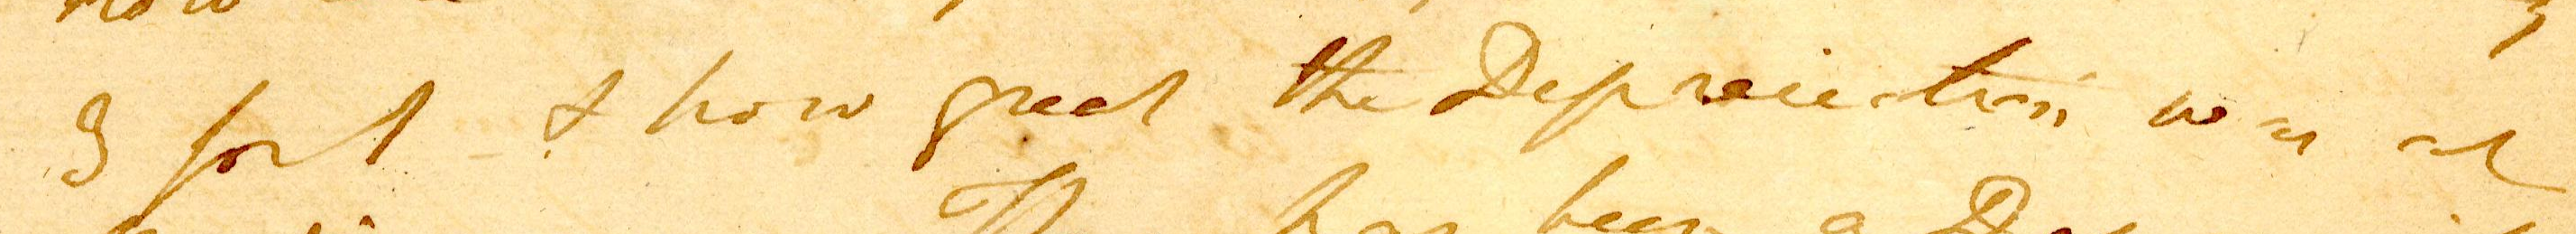3 for 1 & how great the Declaration was at
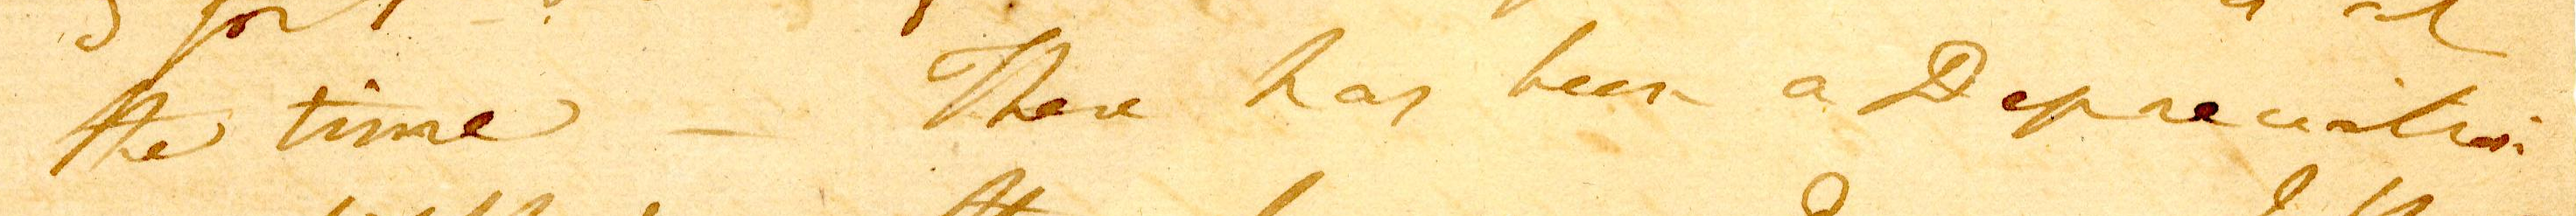the time. There has been a Depreciation
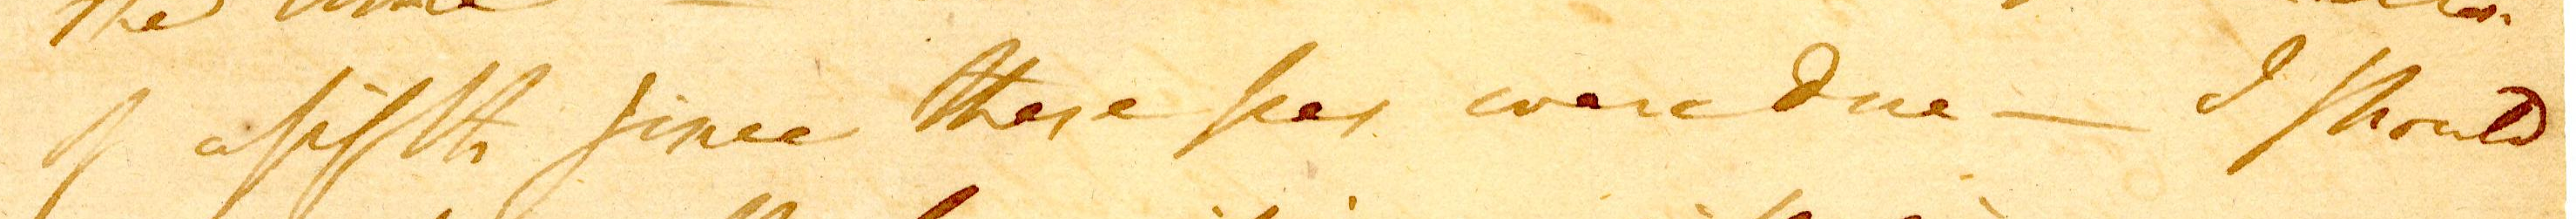of a fifth since these fees were due. I should
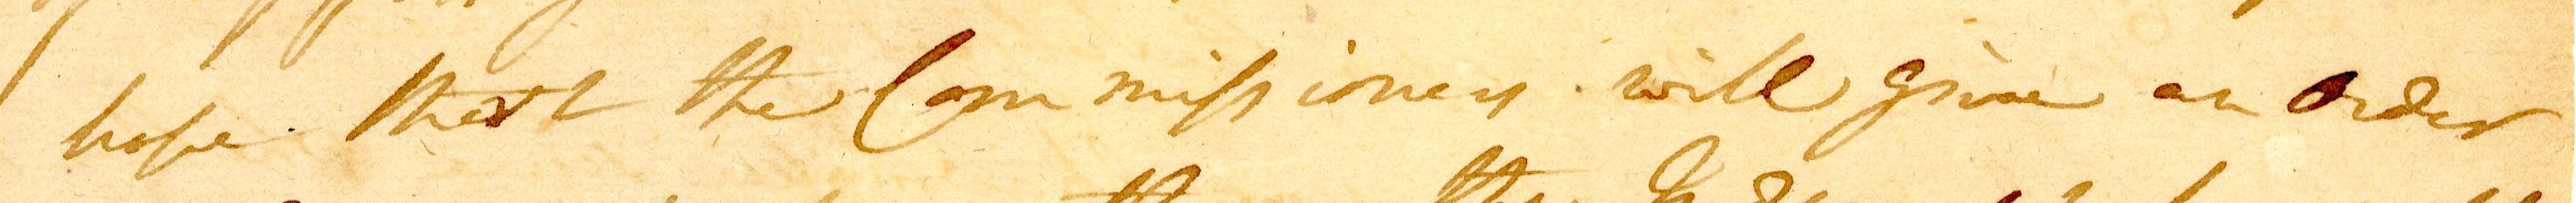hope that the Commissioners will give an Order
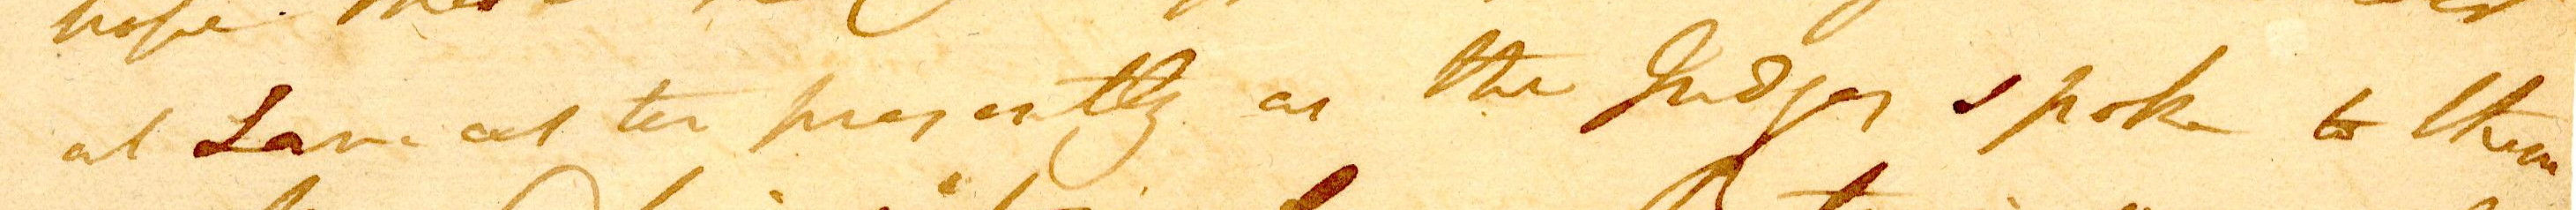at Lancaster presently as the Judges spoke to them
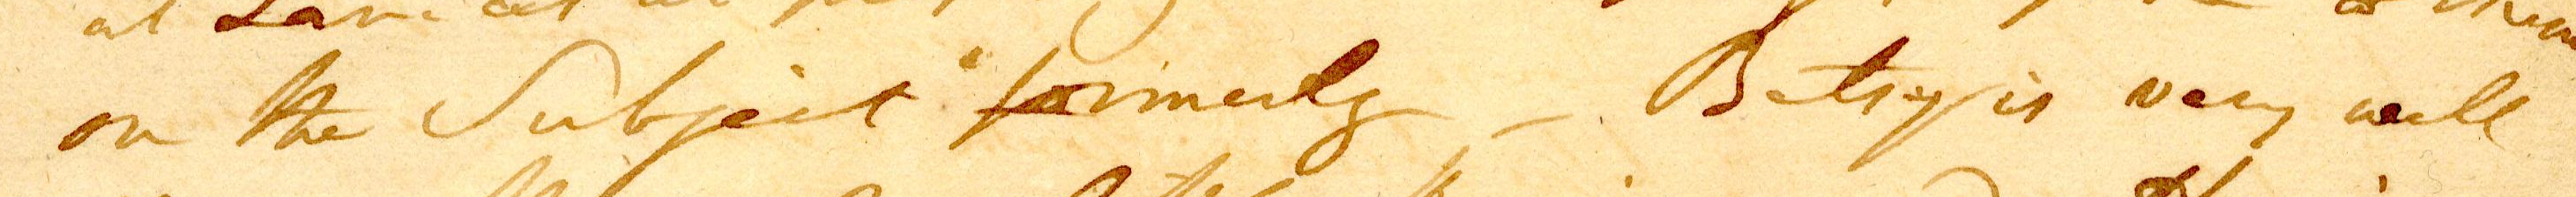on the Subject formerly. Betsy is very well
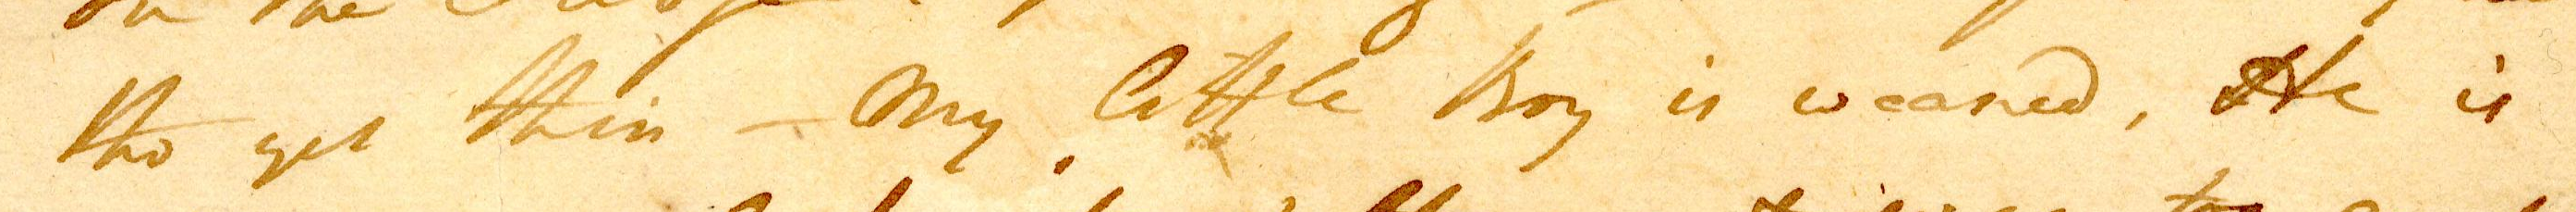tho yet thin. My little Boy is weaned, He is
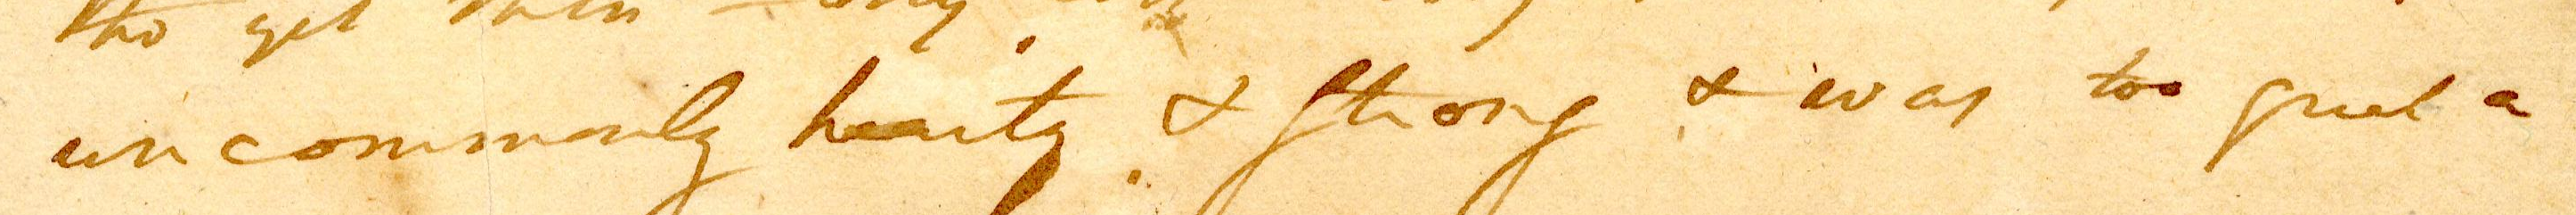uncommonly hearty & strong & was too great a
